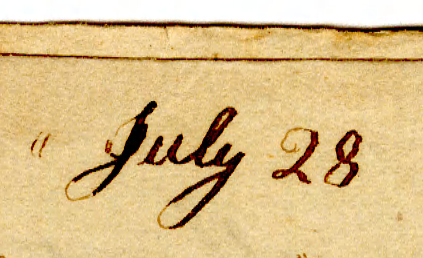July 28
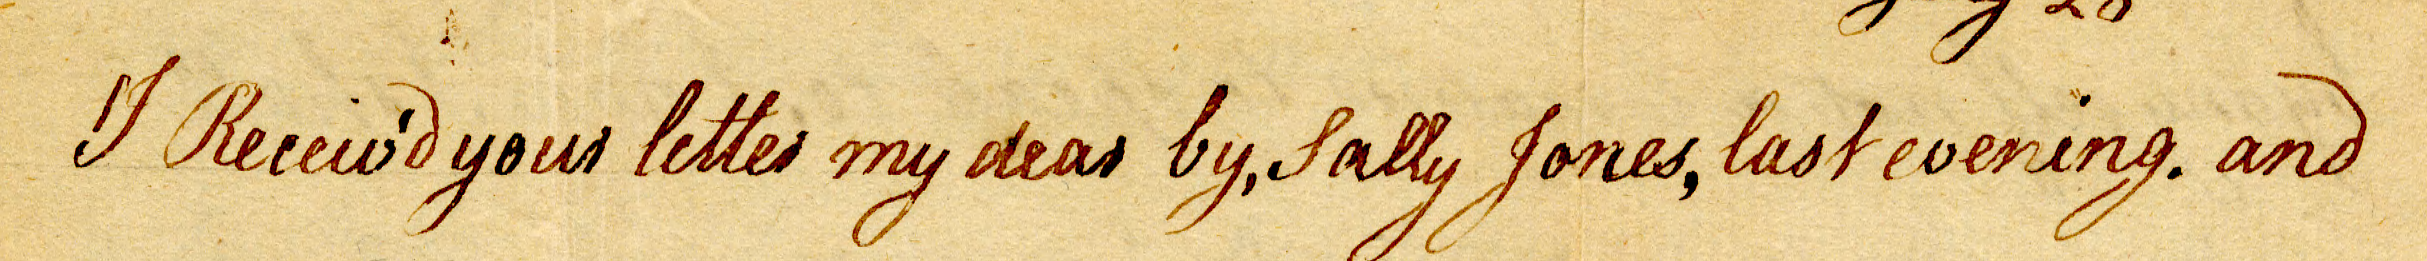I Receiv'd your letter my dear by, Sally Jones, last evening. and
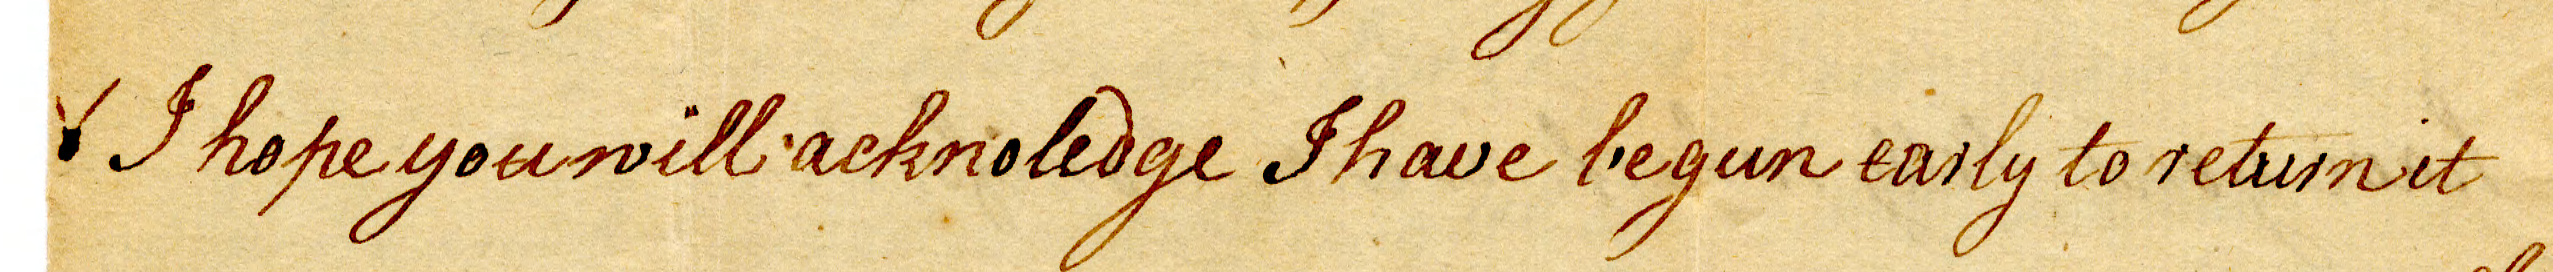I hope you will acknoledge I have begun early to return it
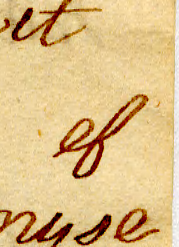lf
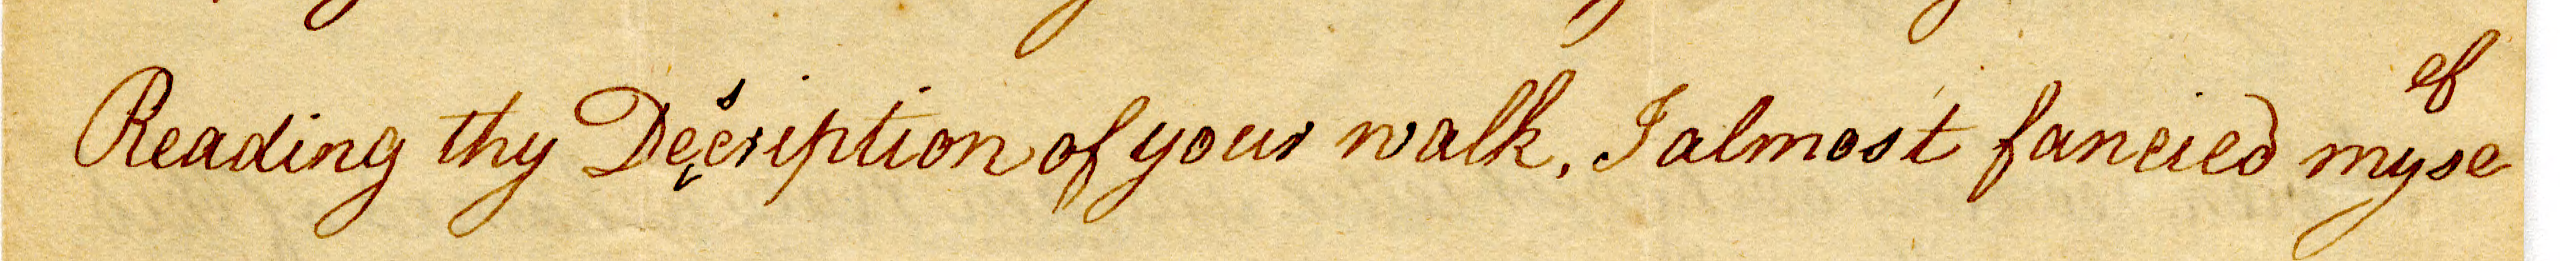Reading thy De^scription of your walk, I almost fancied myse
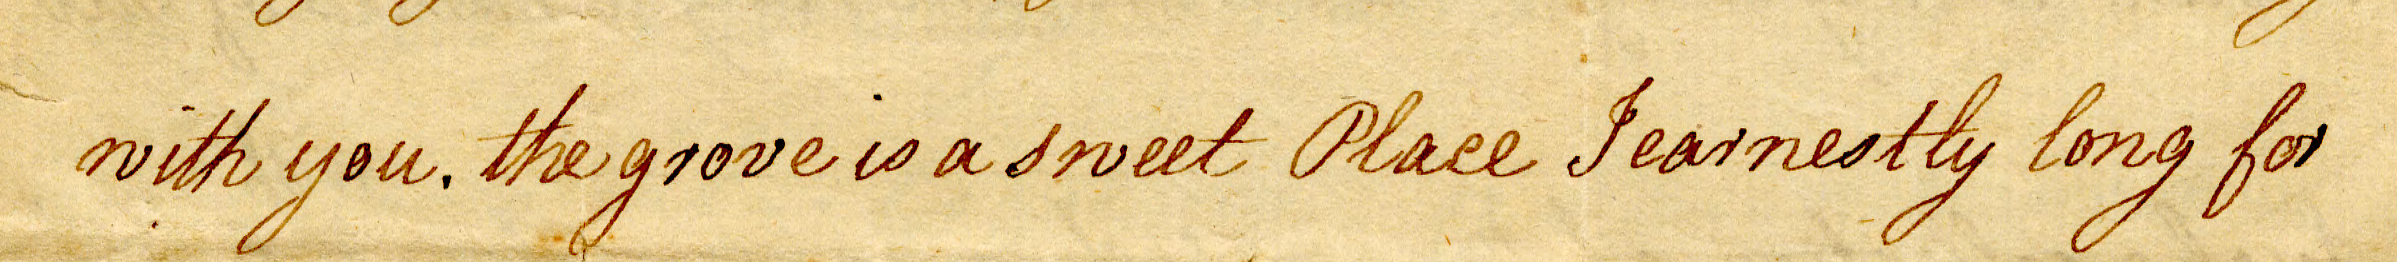with you. the grove is a sweet Place I earnestly long for
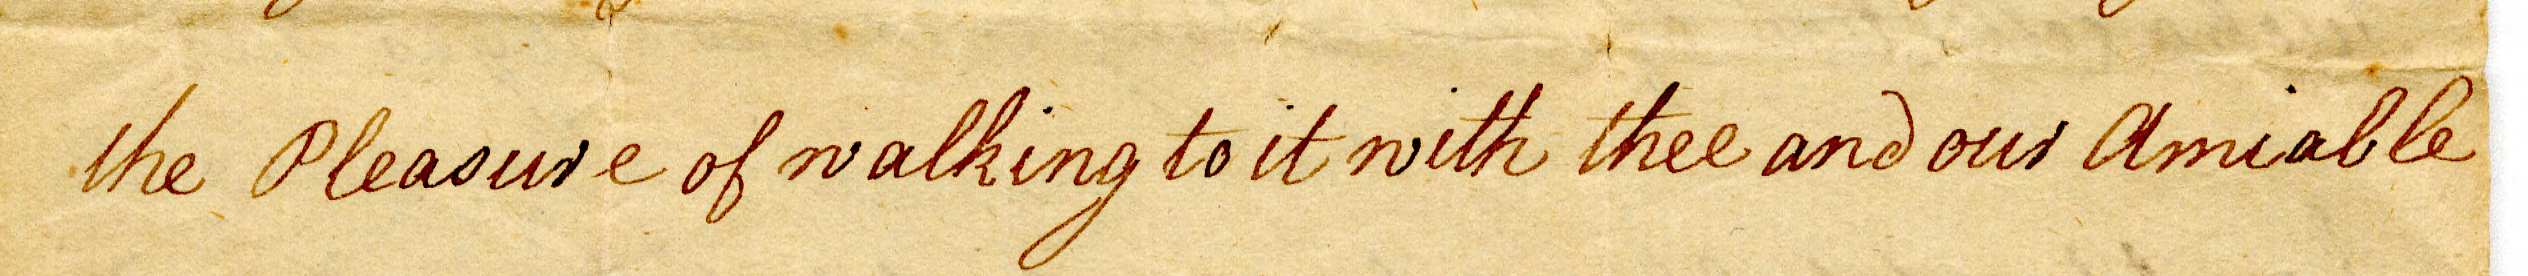the Pleasure of walking to it with thee and our amiable
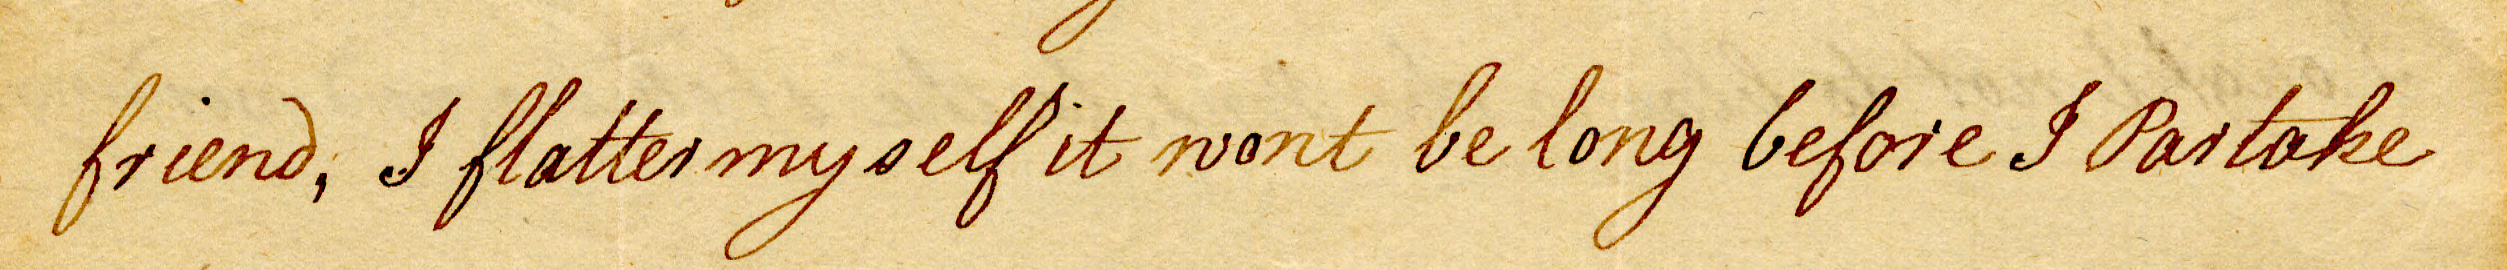friend, I flatter myself it wont be long before I Partake
